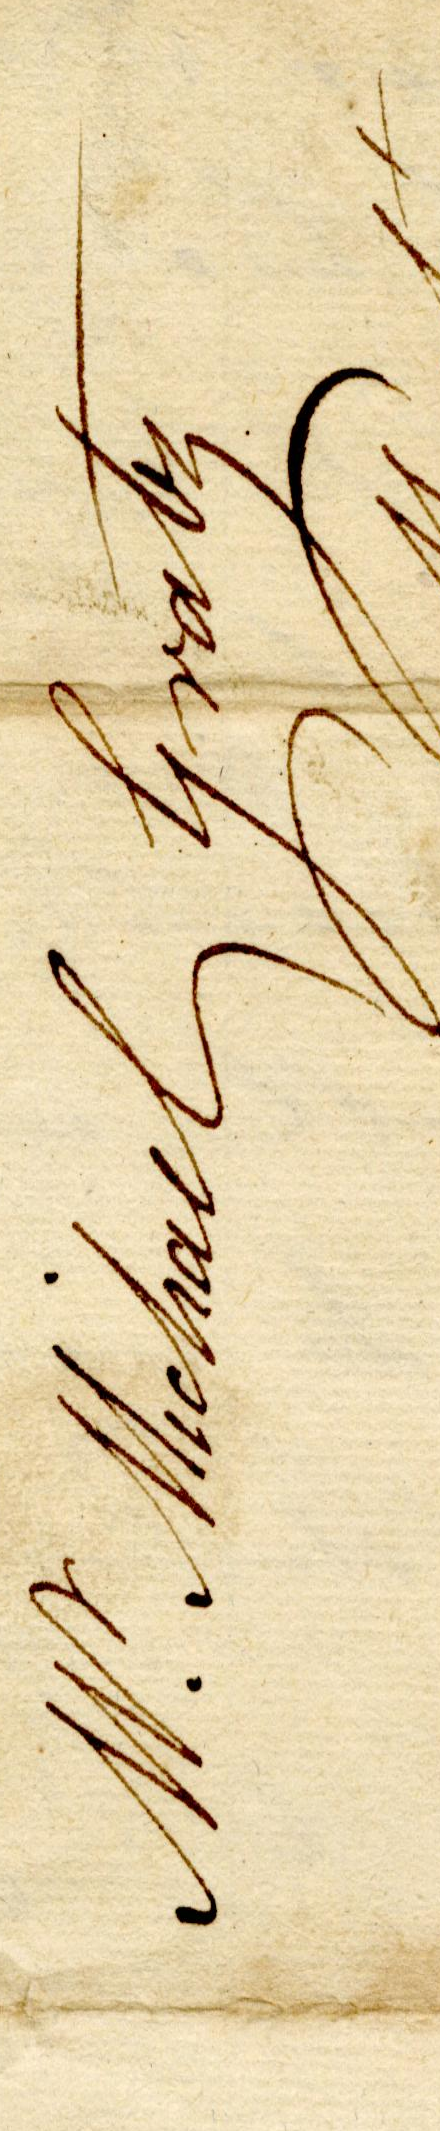M^r Michael Gratz
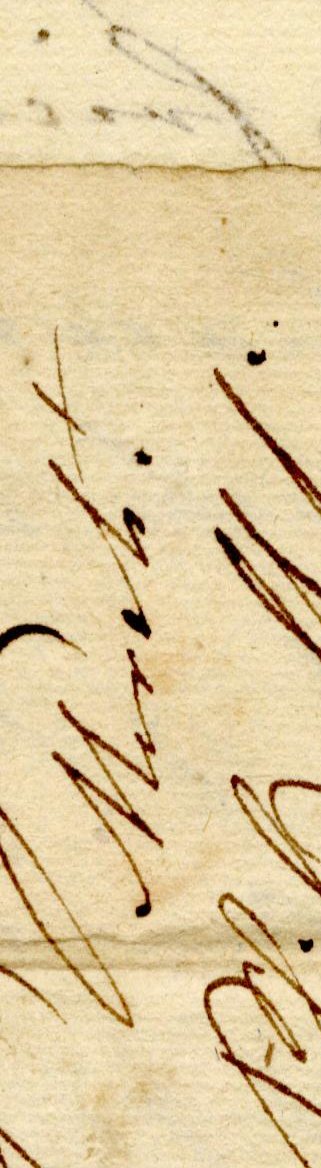Merch^t
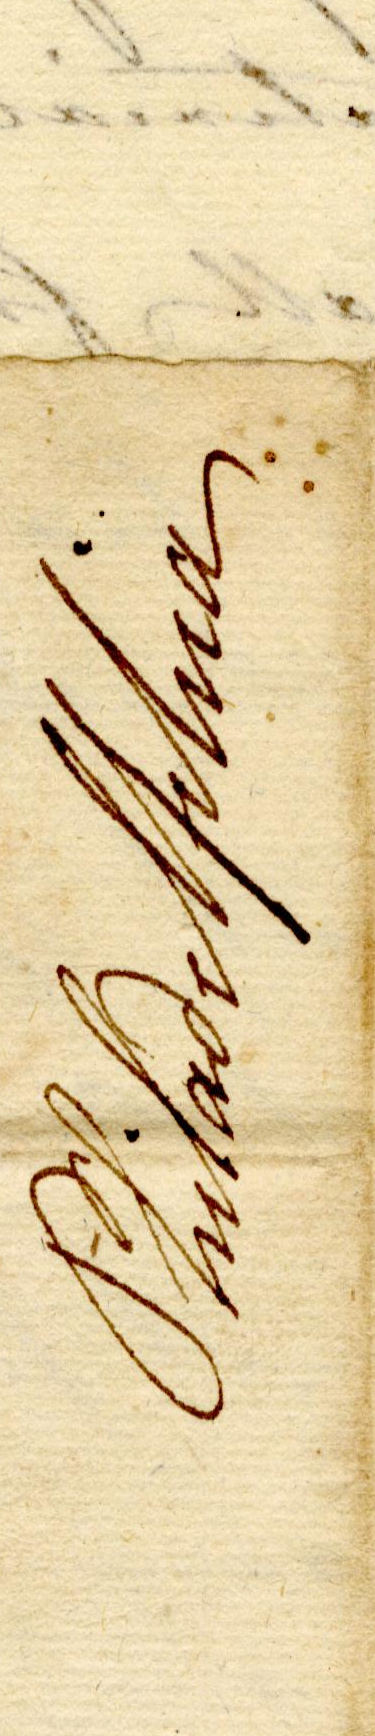Philadelphia
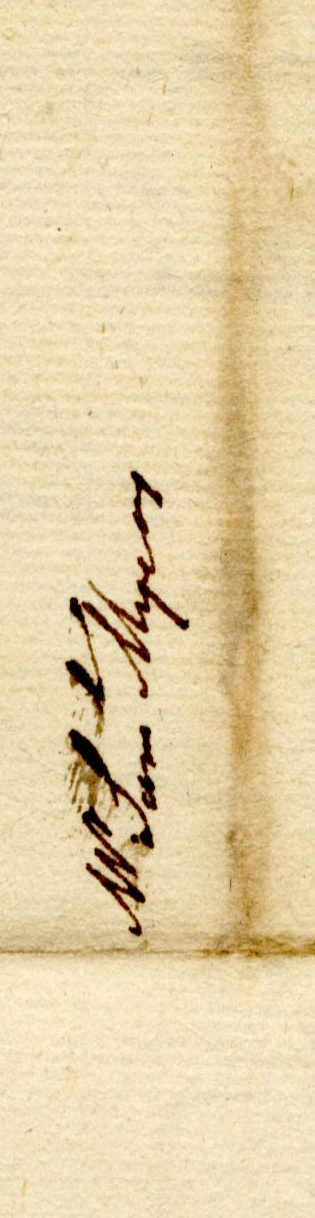M^r Sam^l Myers
